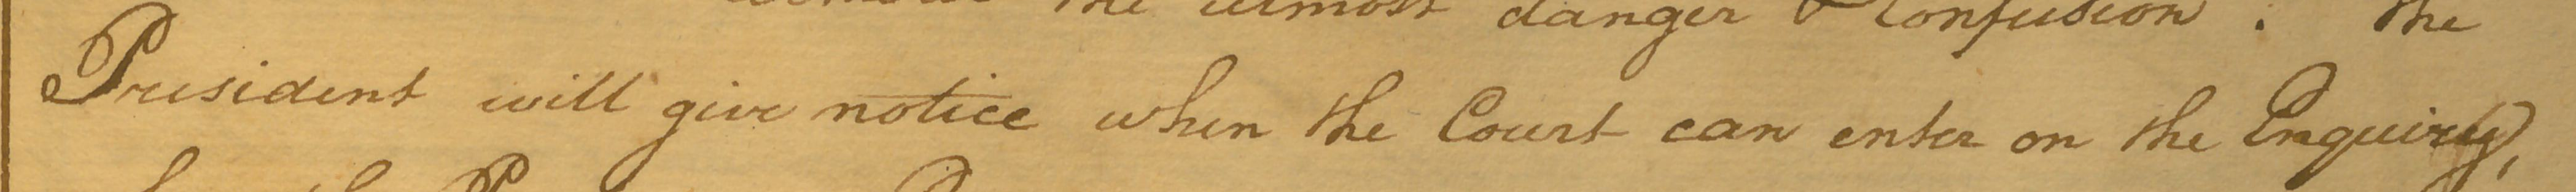President will give notice when the Court can enter on the Enquiry,
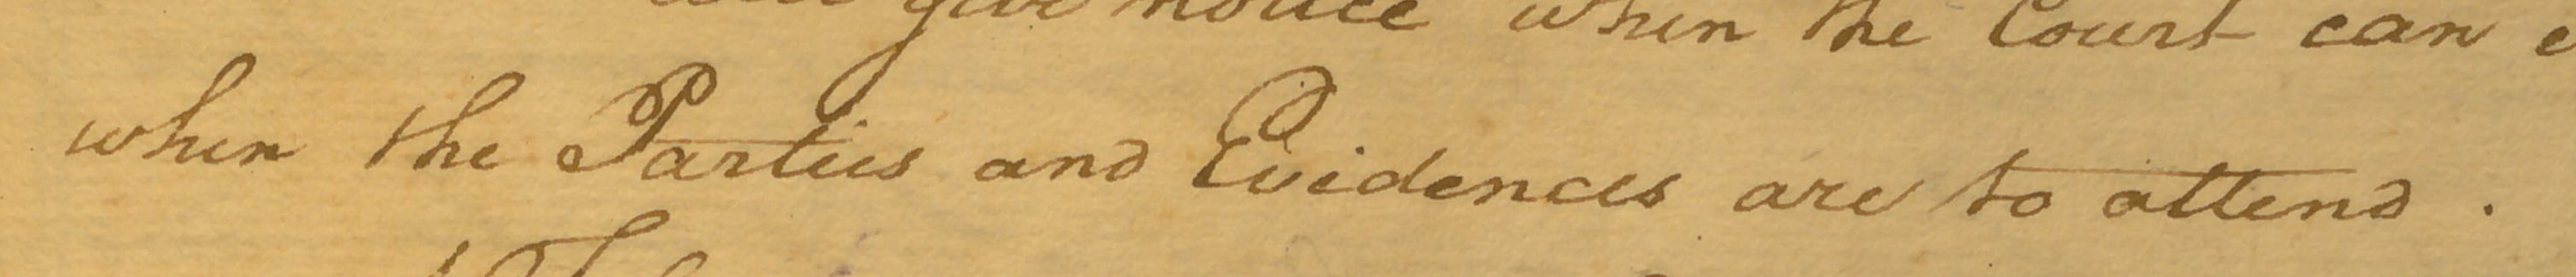when the Parties and Evidences are to attend.
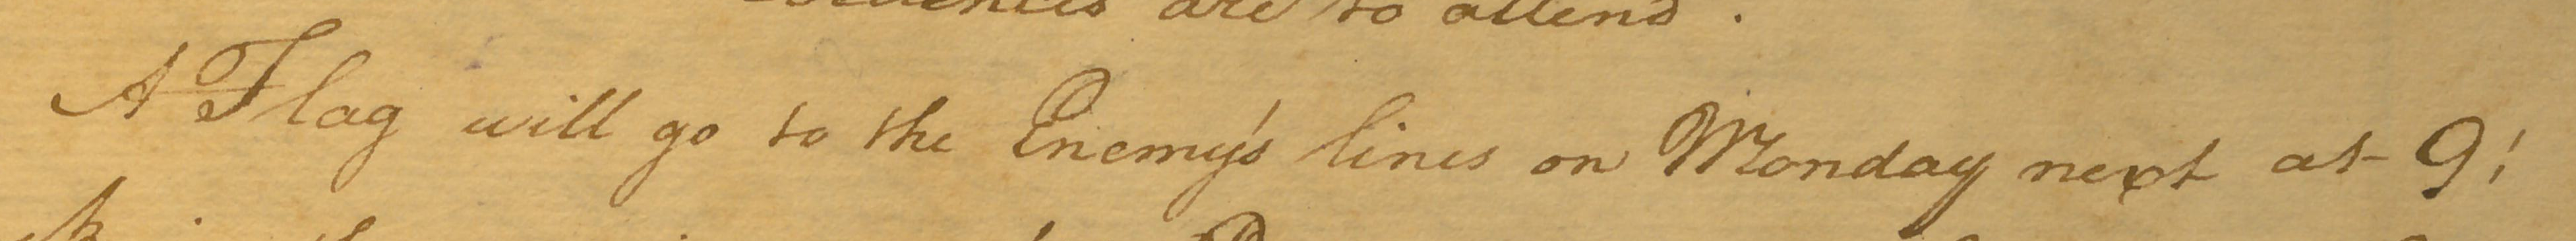A Flag will go to the Enemy's lines on Monday next at 9:
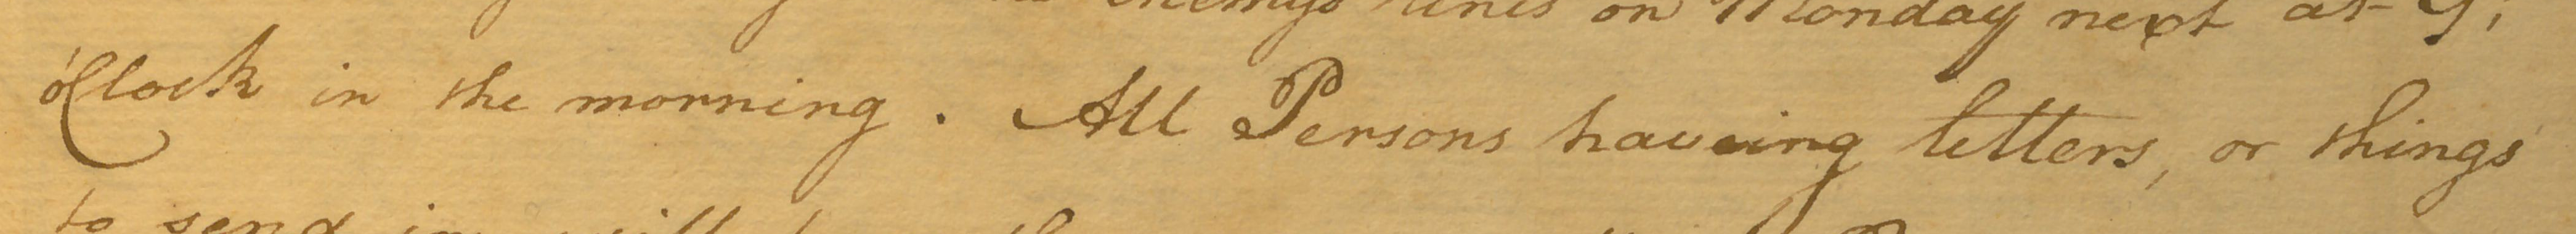o'Clock in the morning. All Persons having letters, or things
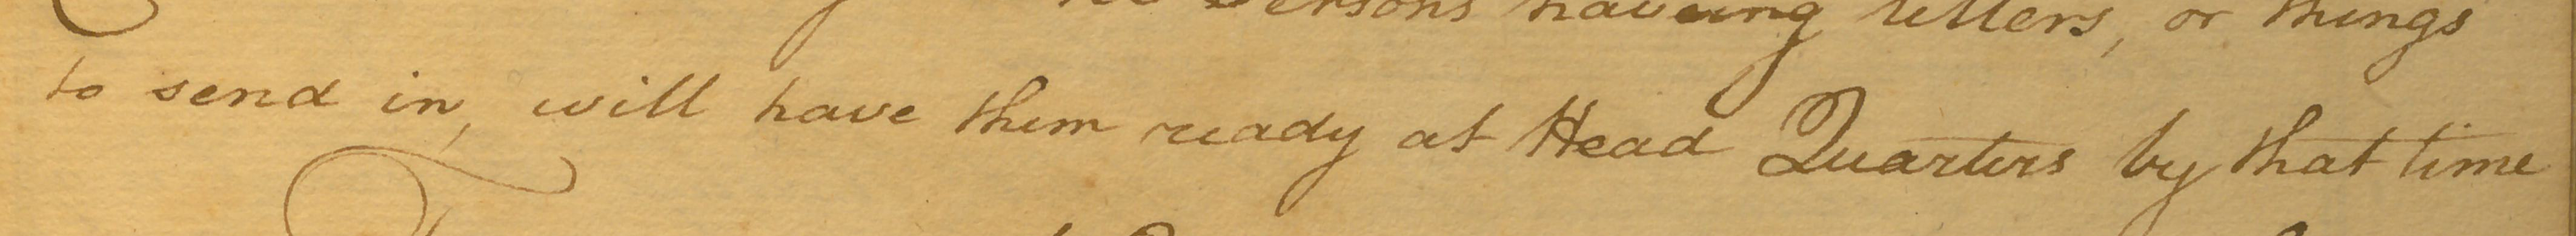to send in, will have them ready at Head Quarters by that time
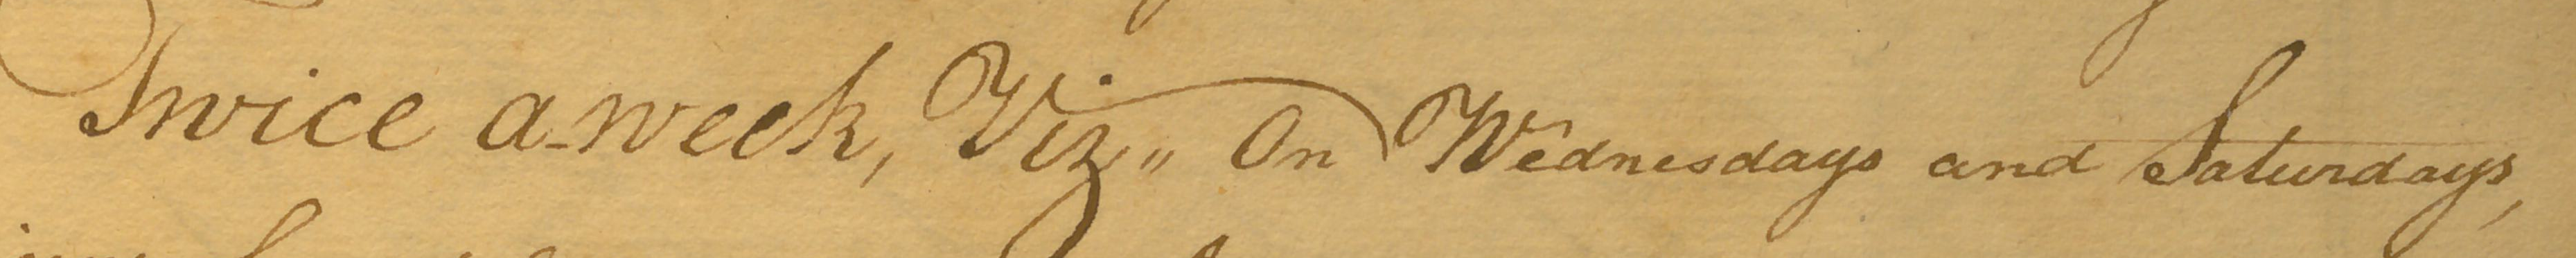Twice a week, Viz. On Wednesdays and Saturdays,
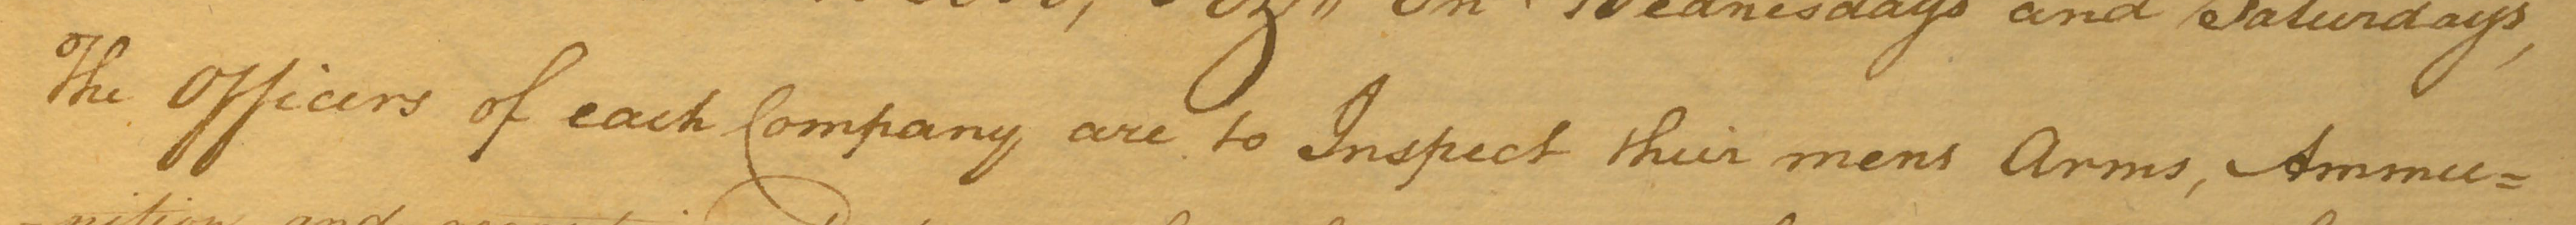The Officers of each Company are to Inspect their mens Arms, Ammu-
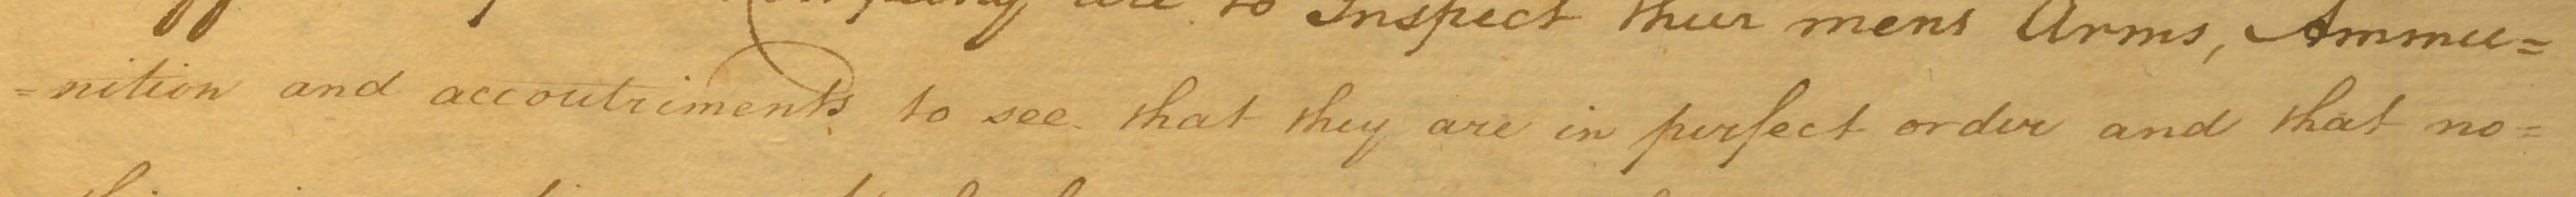-nition and accoutriments to see that they are in perfect order and that no-
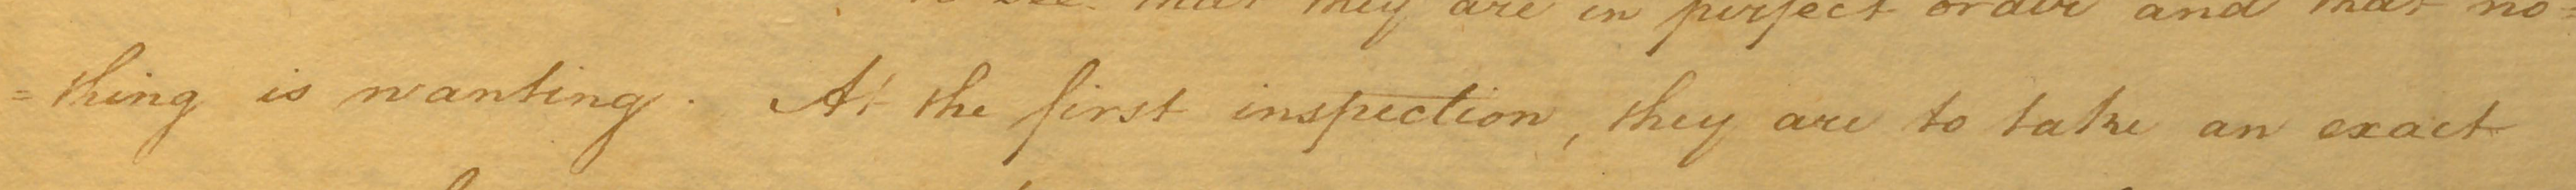-thing is wanting. At the first inspection, they are to take an exact
